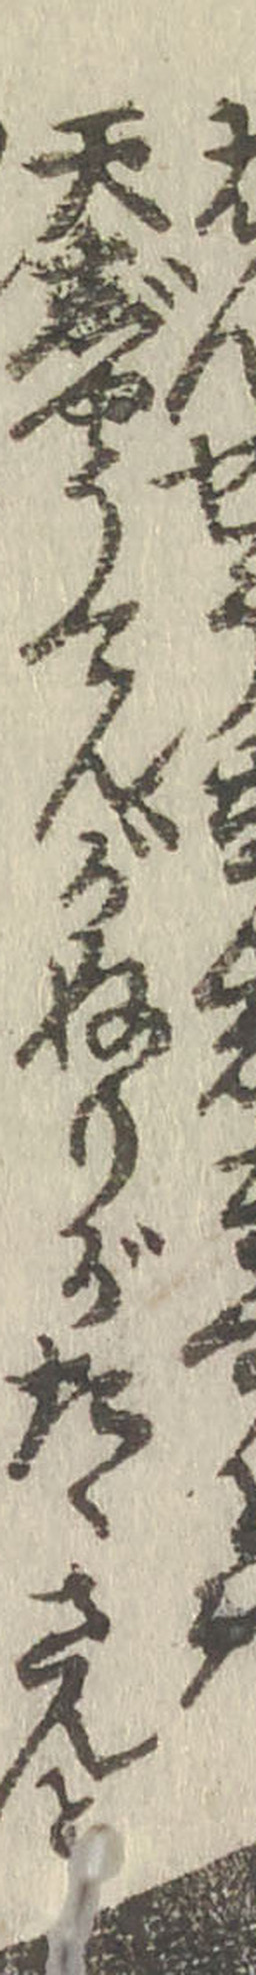天じやうてんがぬりがたくさんと
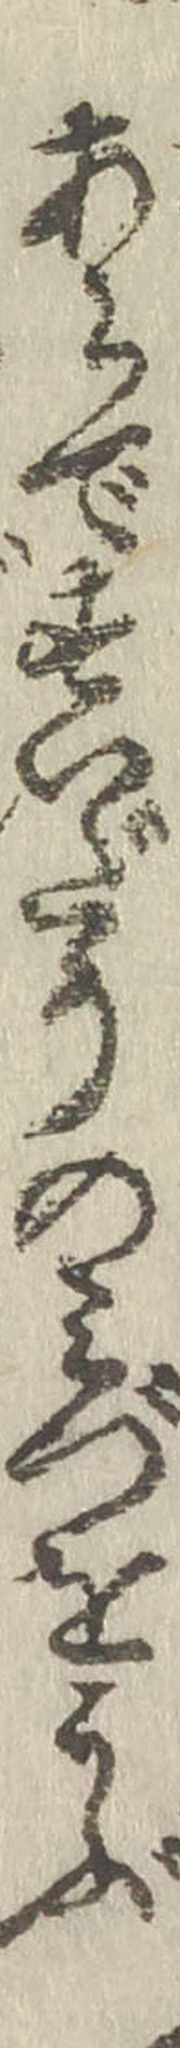あらですいだうのみづをうぶ
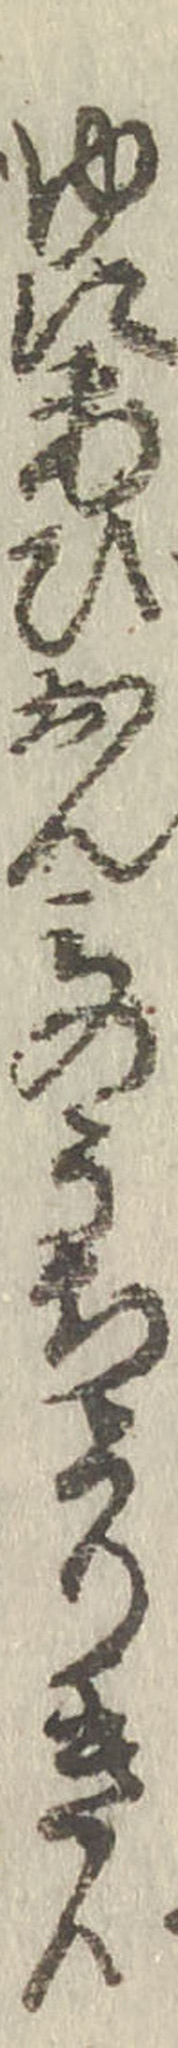ゆにあびおんみのうちよりきん
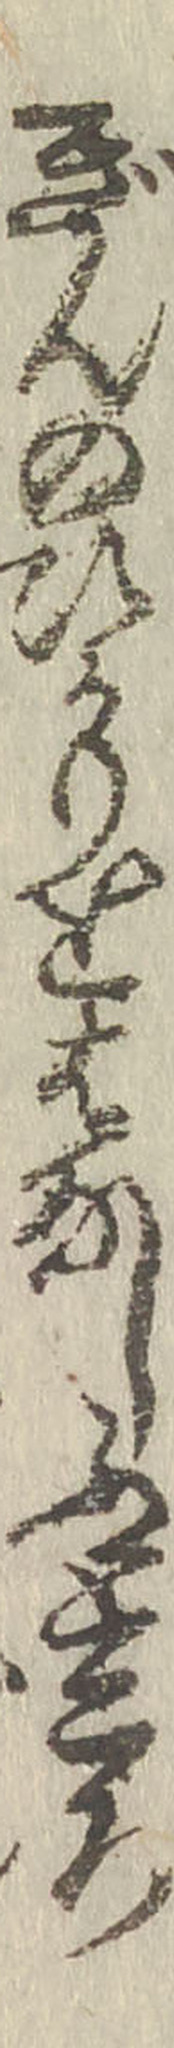ぎんのひかりをはなしふところ
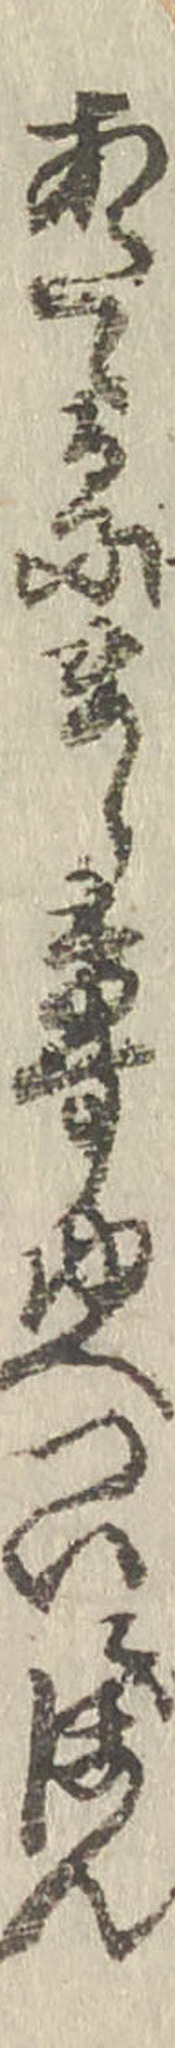アタてるにましますゆへついにぼん
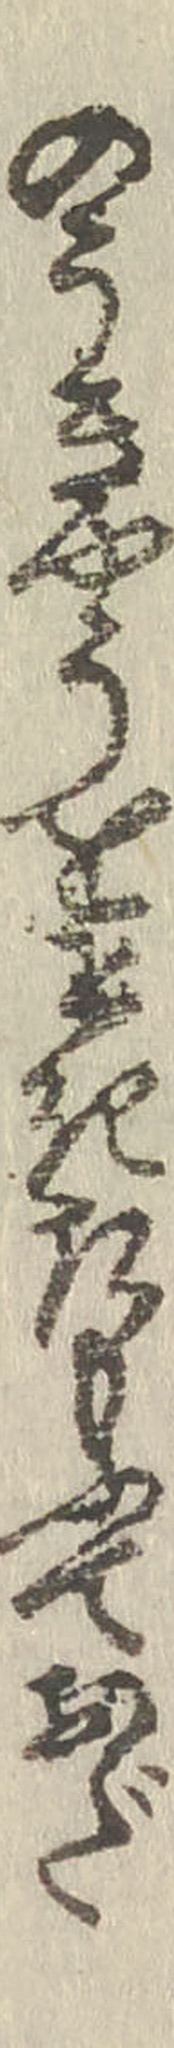のうきやうをときたもふておだ
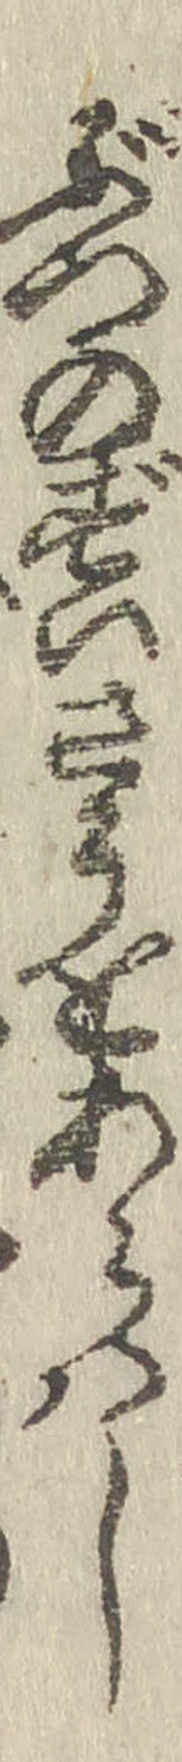ぶつのずいさうをあらはし
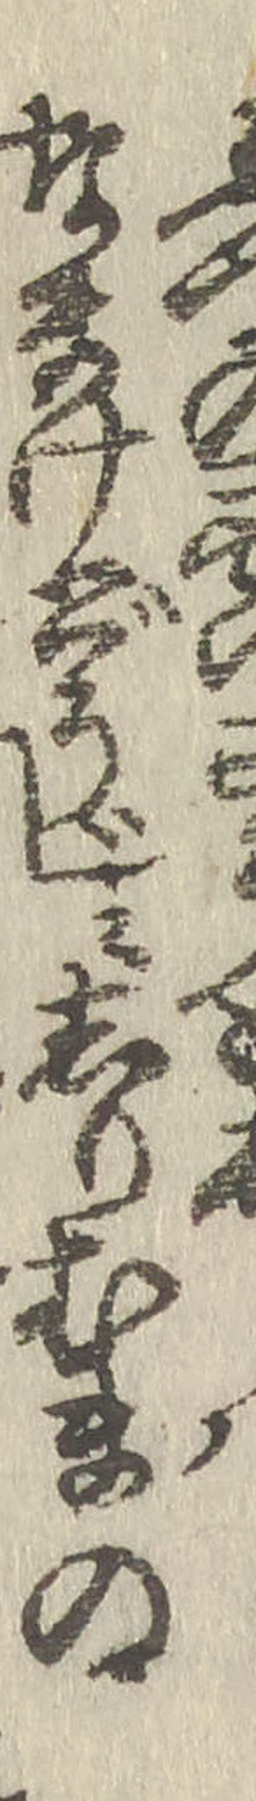なまけどうじをしりむまの
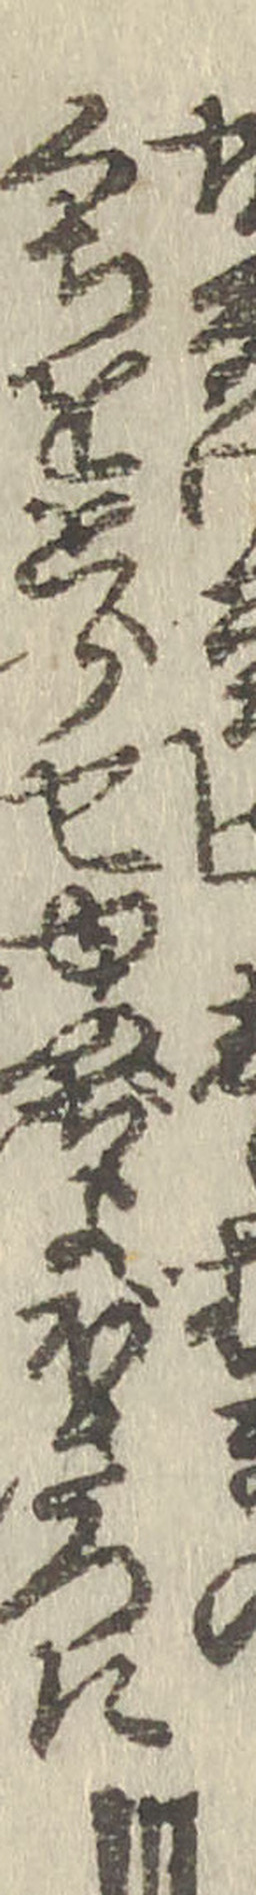口をとらせゆふぢよぼさつに
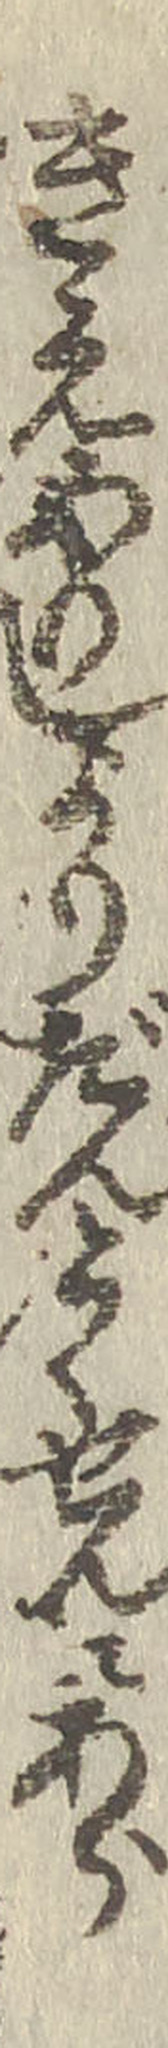きめやりしよりだんとくせんにあら
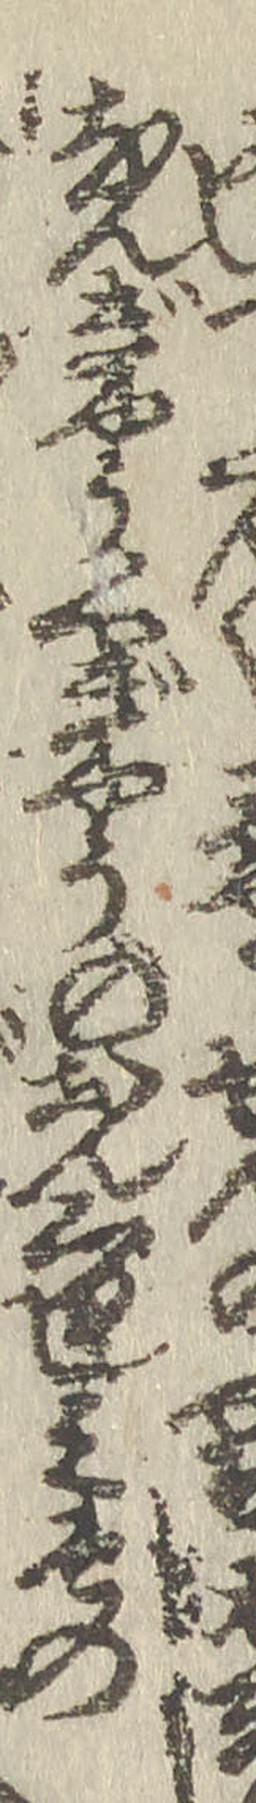なんぎやうくぎやうのおんくるしみその
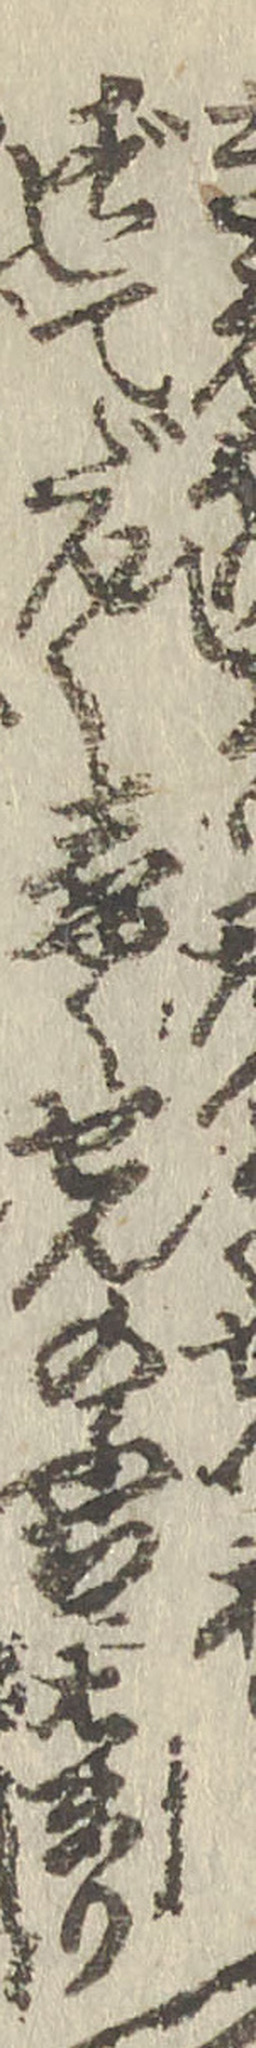ずしてだん〳〵しやくせんのふちにはまり
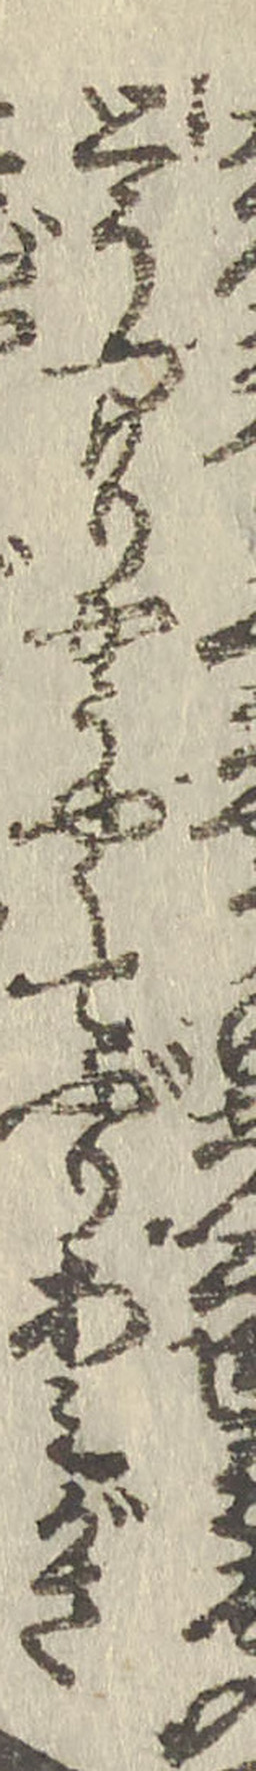とうつもりやうくてぶりあみがさ
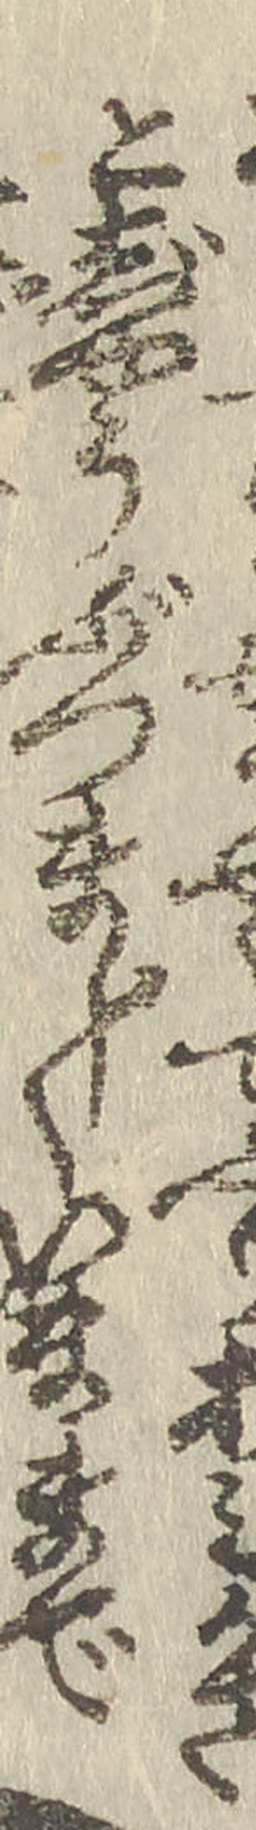とじやうぶつまし〳〵いままで
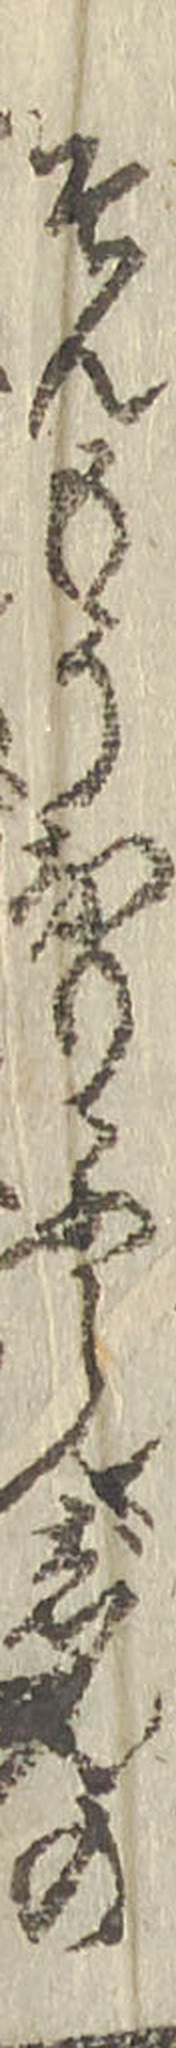そんもうなりふしんじんの
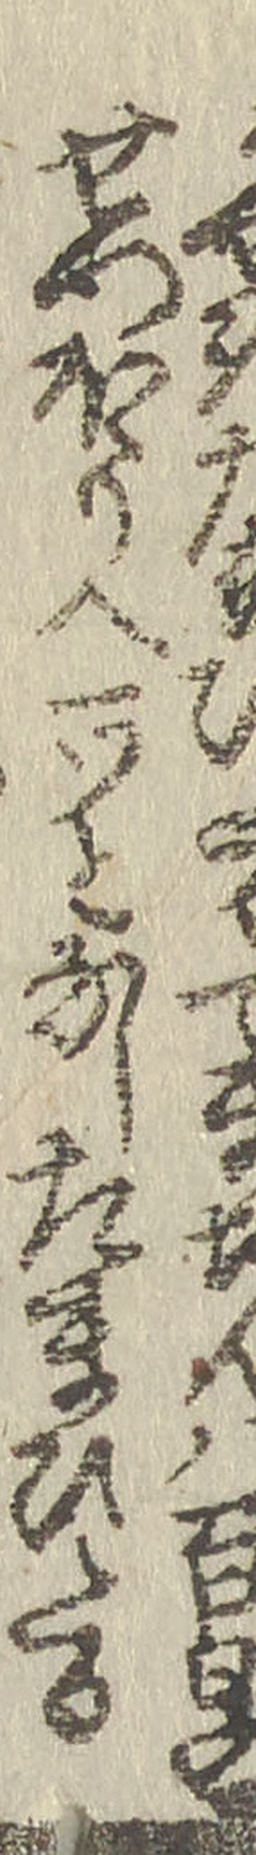せつほりへ一つをなしたまひたる
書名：左官無二如来家根之瓦土蔵菩薩開帳由来記
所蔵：東京大学総合図書館 General Library in the University of Tokyo, JAPAN
